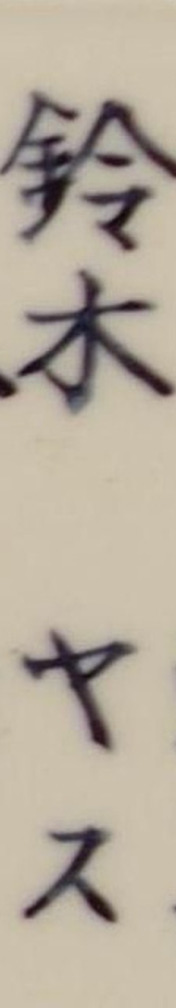鈴木ヤス
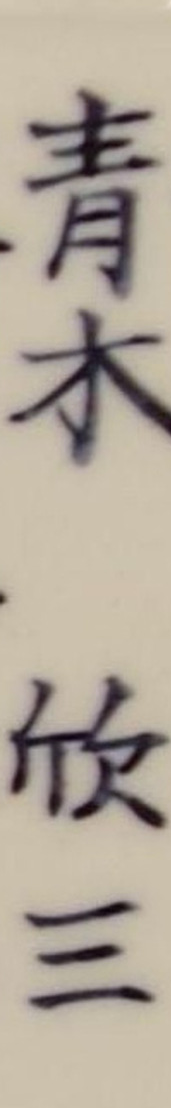青木欣三
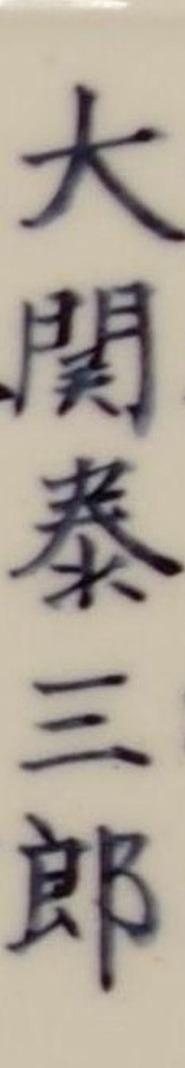大関泰三郎
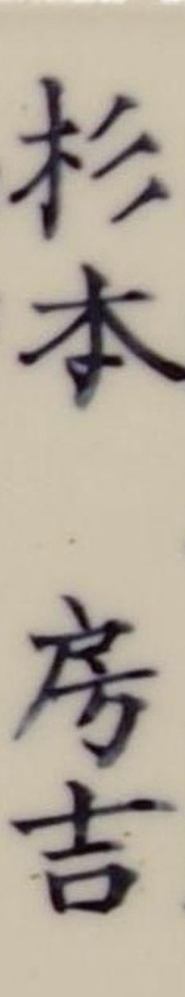杉本房吉
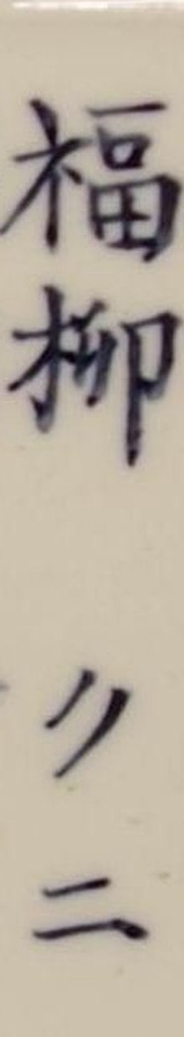福柳クニ
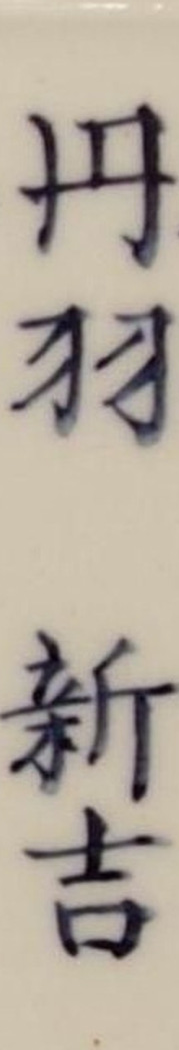丹羽新吉
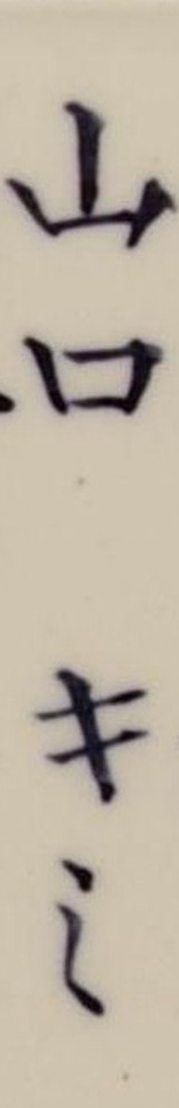山口キミ
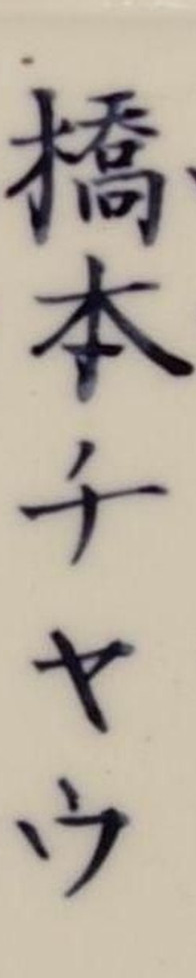橋本チヤウ
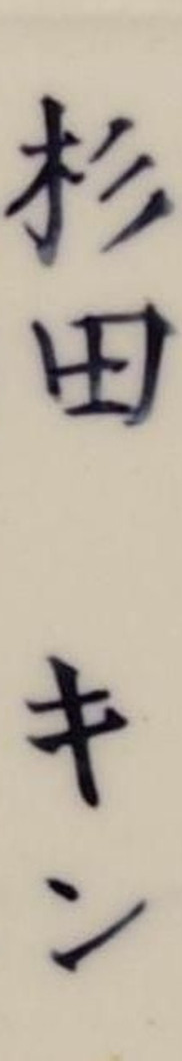杉田キン
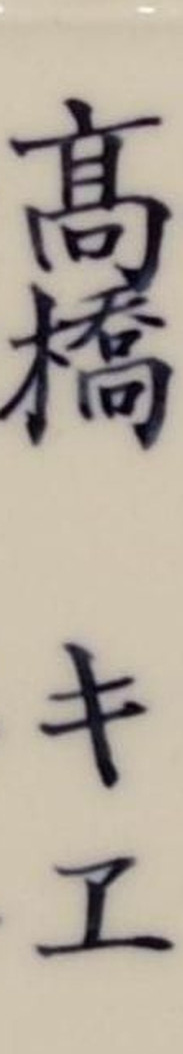高橋キヱ
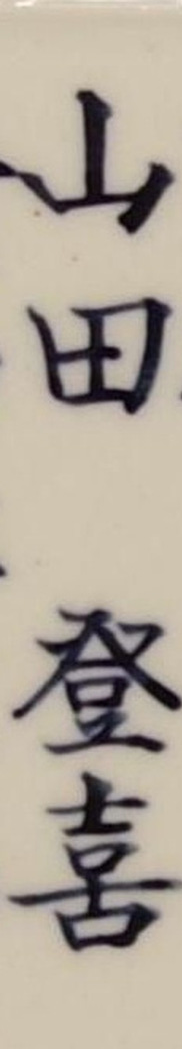山田登喜
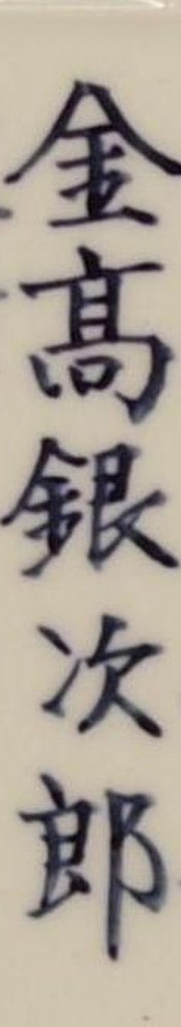金高銀次郎
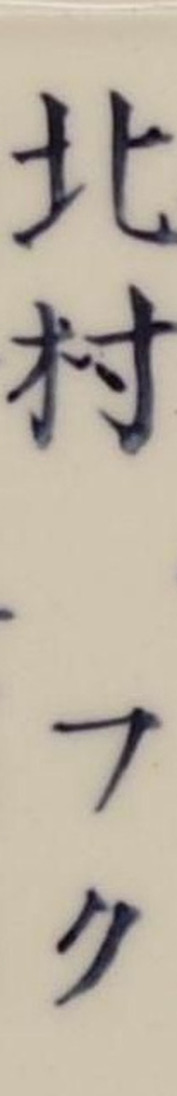北村フク
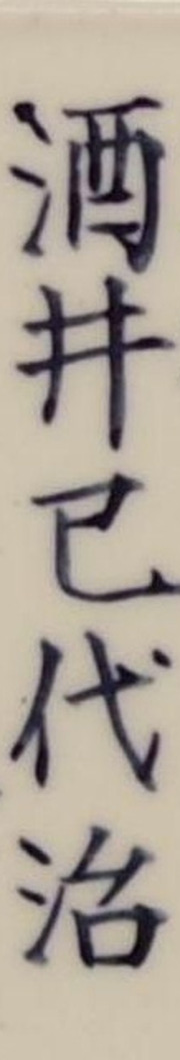酒井巳代治
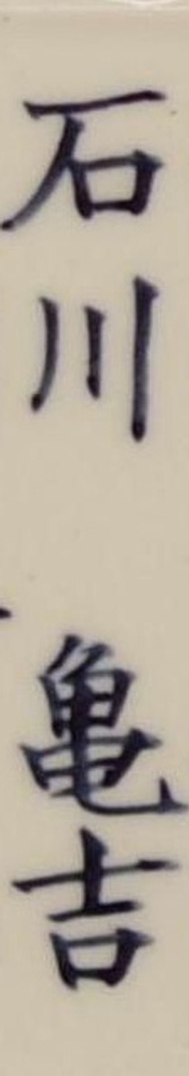石川亀吉
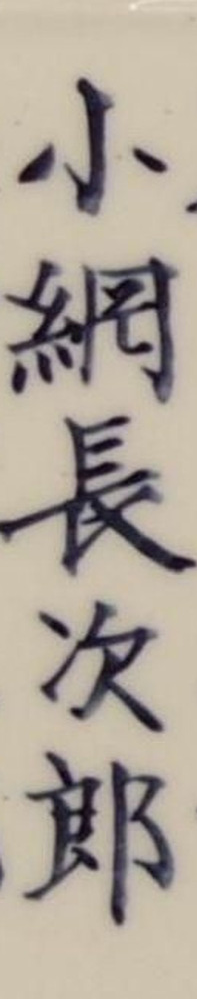小綱長次郎
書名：E~L
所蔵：高野山金剛峯寺
